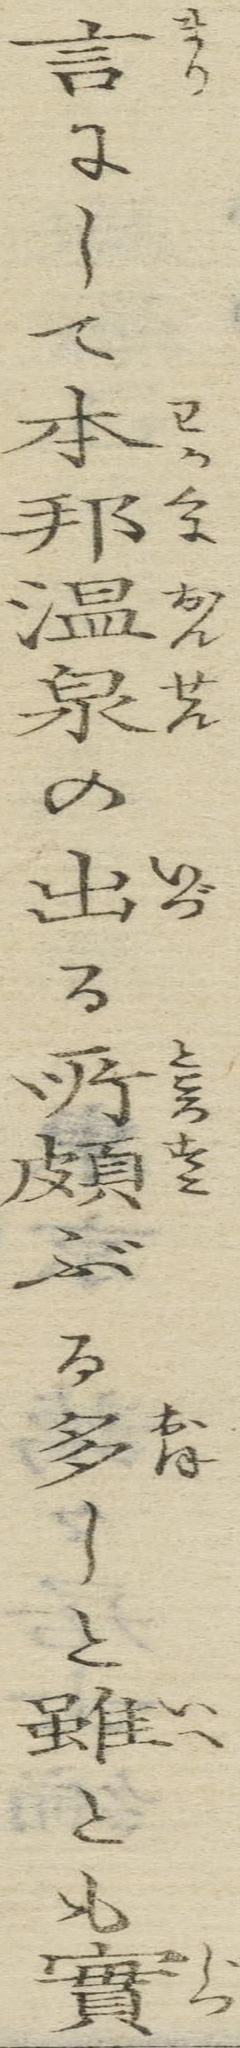言にして本邦温泉の出る所頗ぶる多しと雖とも実
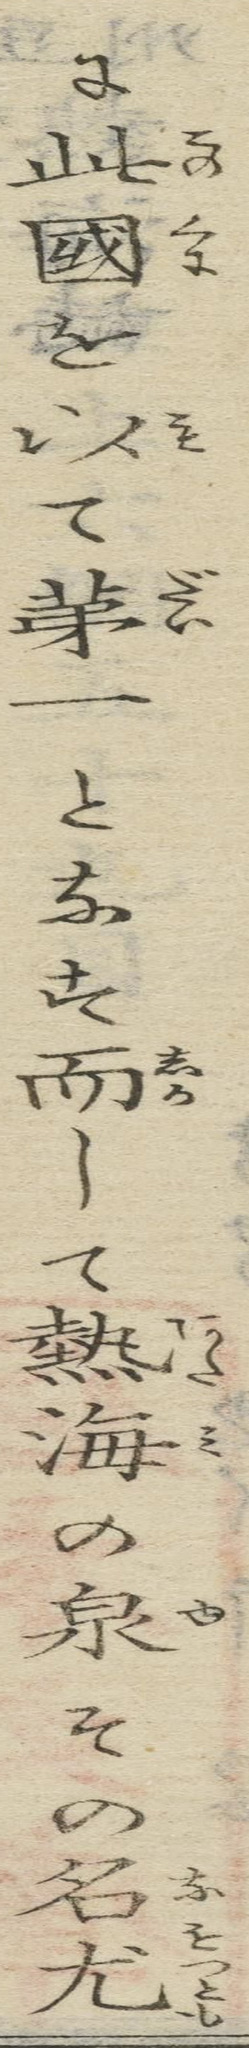に此国を以て第一となす而して熱海の泉その名尤
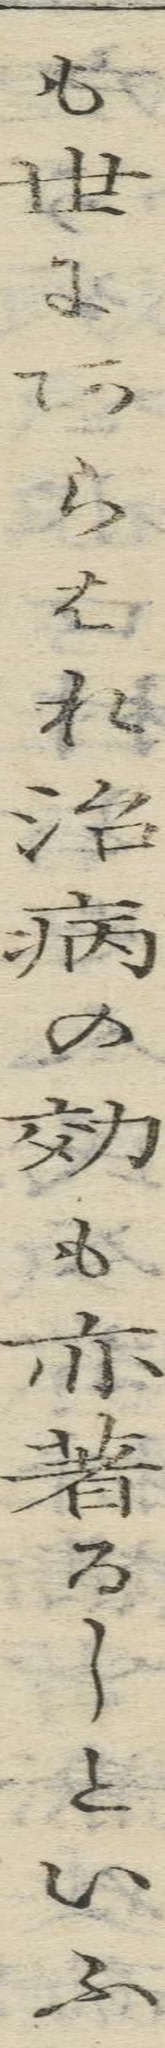も世にあらはれ治病の効も亦著るしといふ
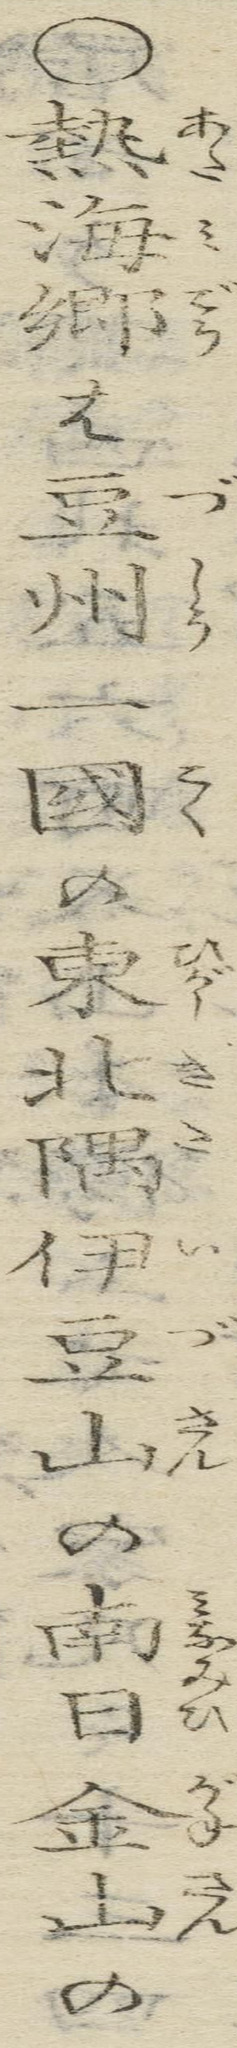○熱海郷は豆州一国の東北隅伊豆山の南日金山の
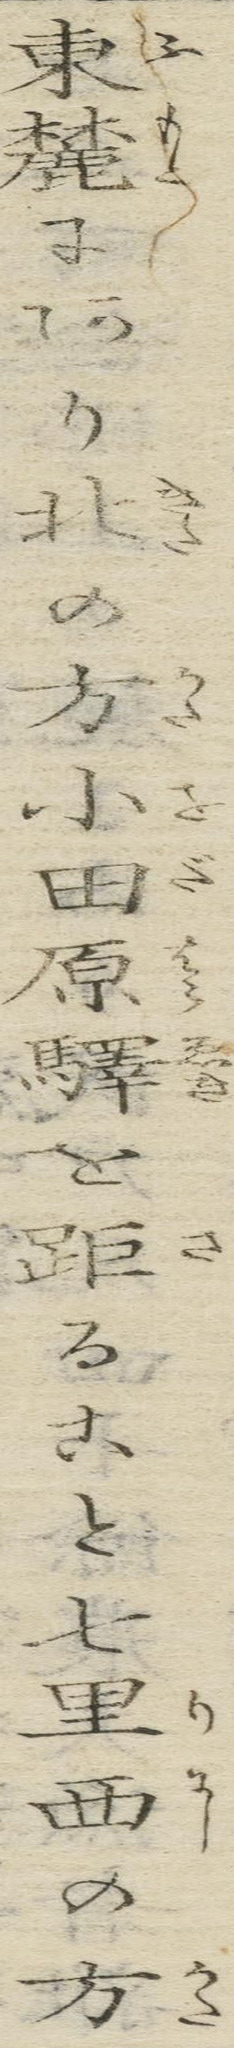東麓）にあり北の方小田原駅を距ること七里西の方
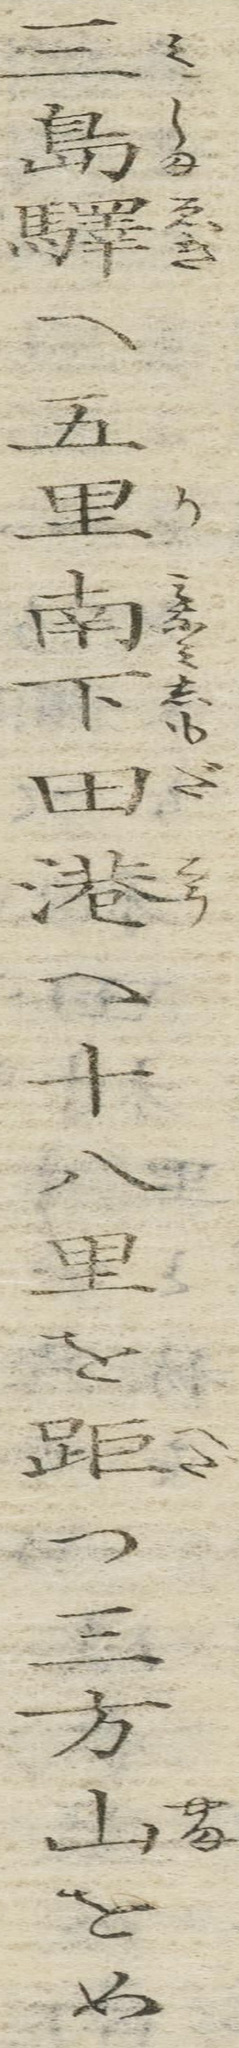三島駅へ五里南下田港へ十八里を距つ三方山）をめ
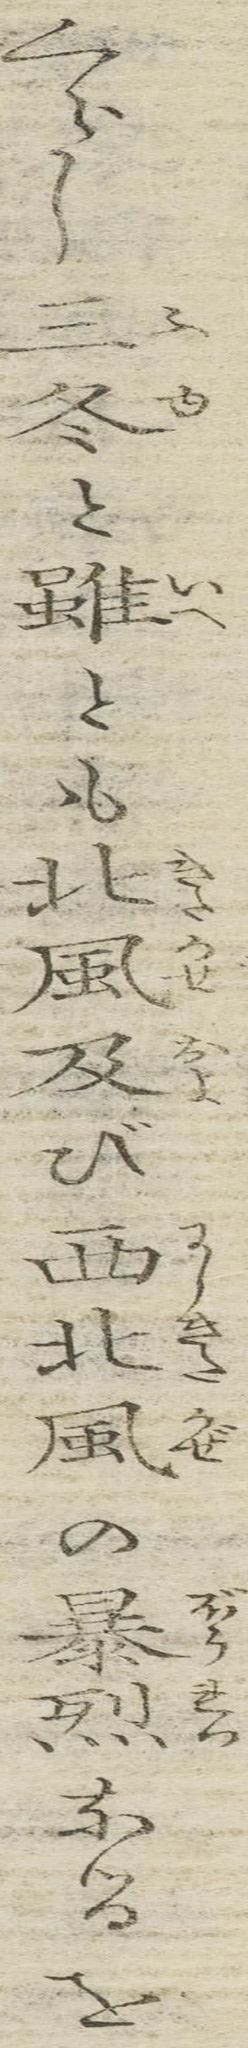くらし三冬と雖とも北風及び西北風の暴烈なるを
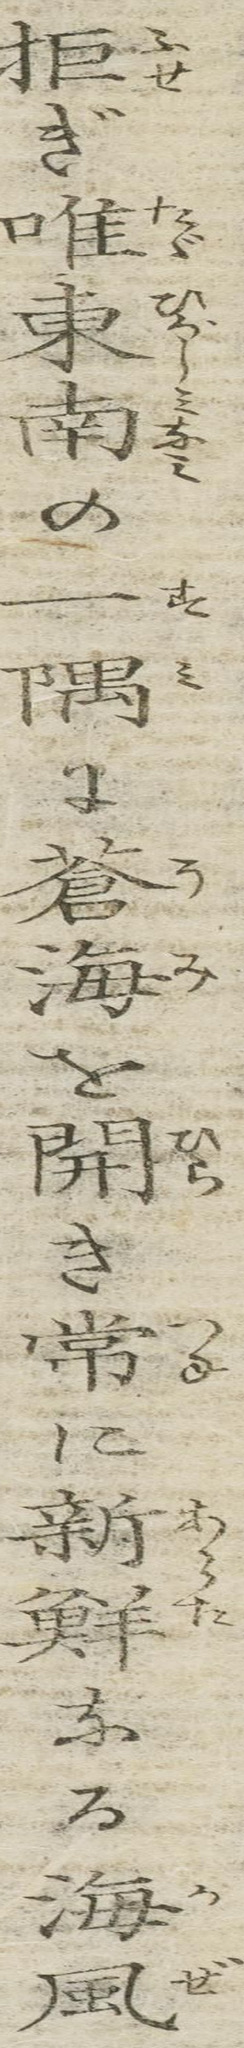拒ぎ唯東南の一隅に蒼海を開き常に新鮮なる海風
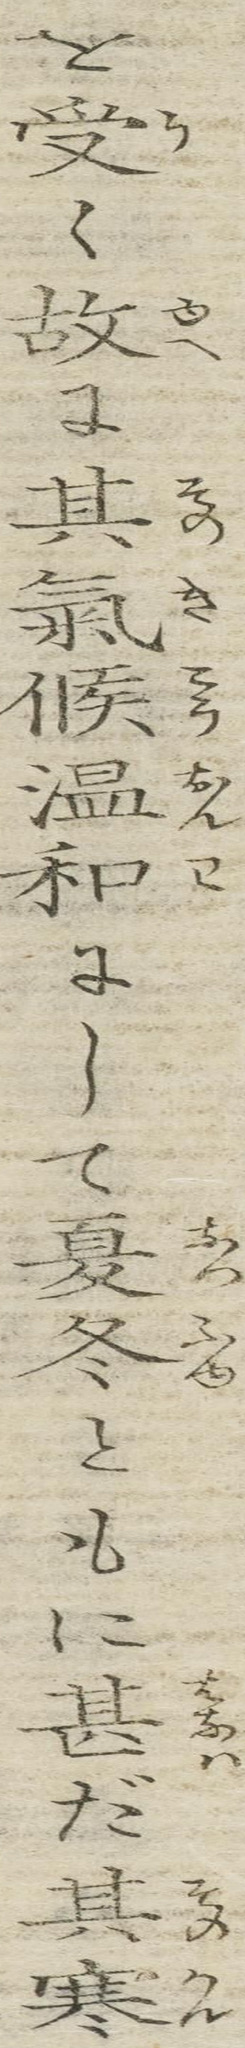を受く故に其気候温和にして夏冬ともに甚だ其寒
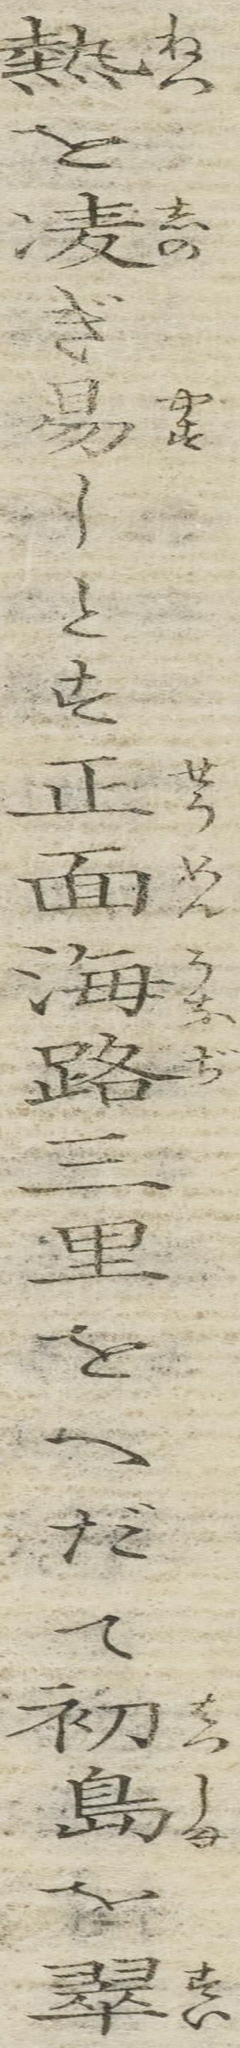熱を凌ぎ易しとす正面海路三里をへだて初島を翠
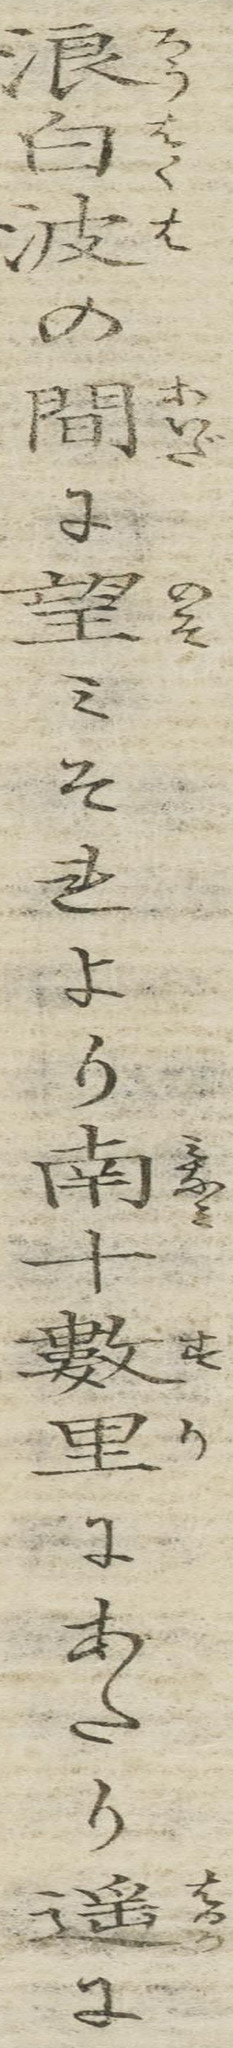浪白波の間に望みそれより南十数里いあたり遥に
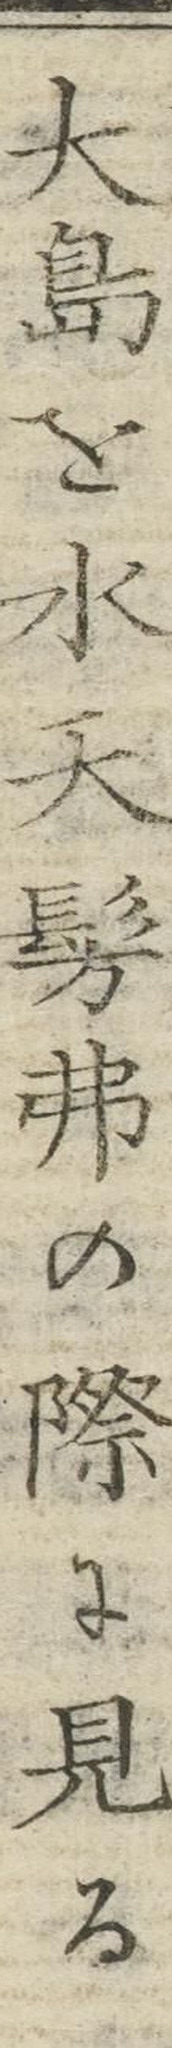大島を水天髣弗の際に見る

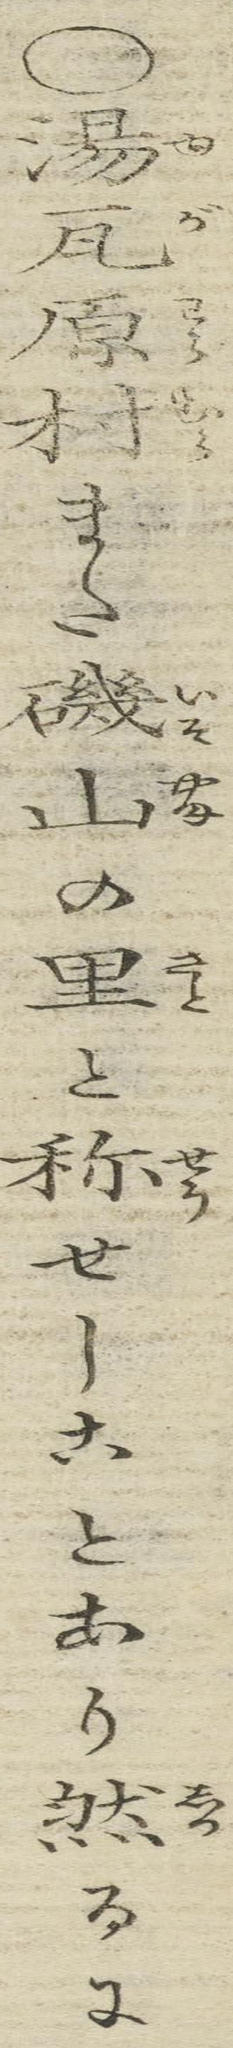○湯瓦原村また磯山の里と称せしことあり然るに
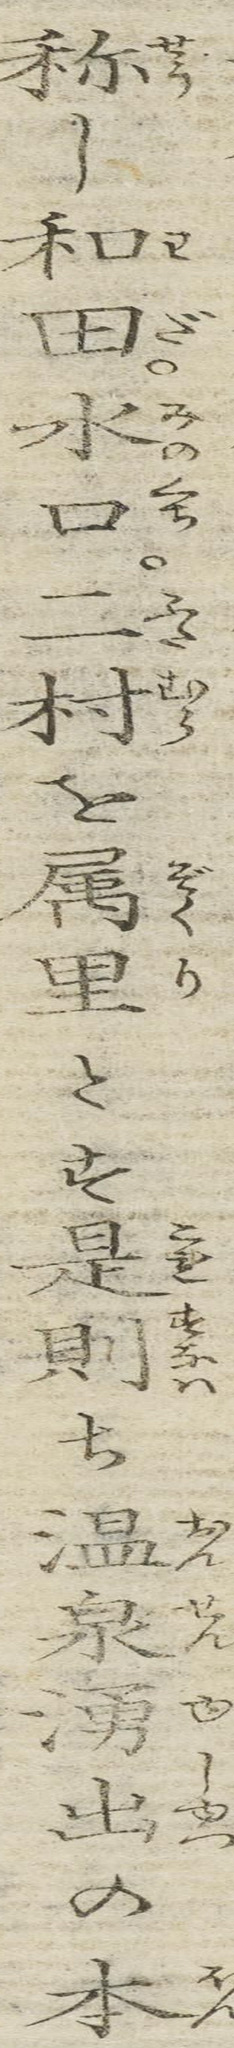称し和田水口二村を属里とす是則ち温泉湧出の本
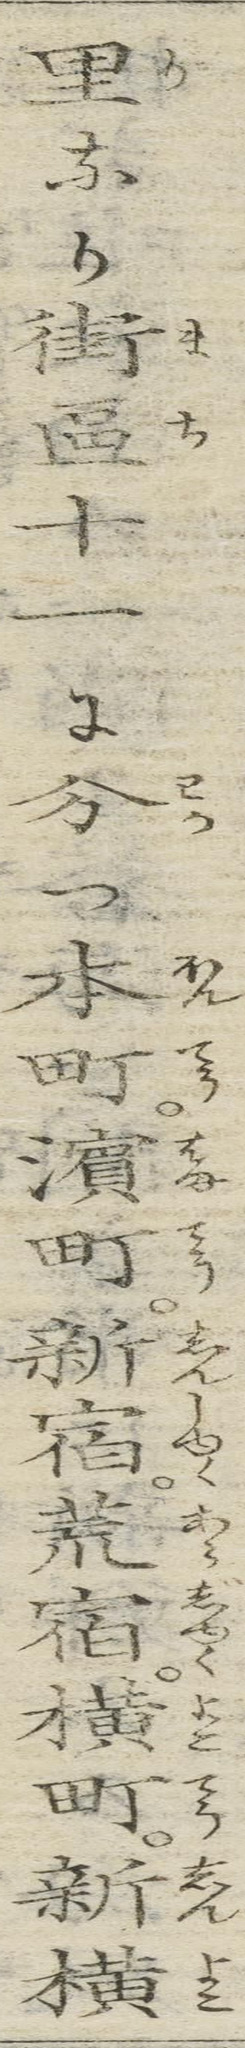里なり街区十一に分つ本町浜町新宿荒宿横町新横
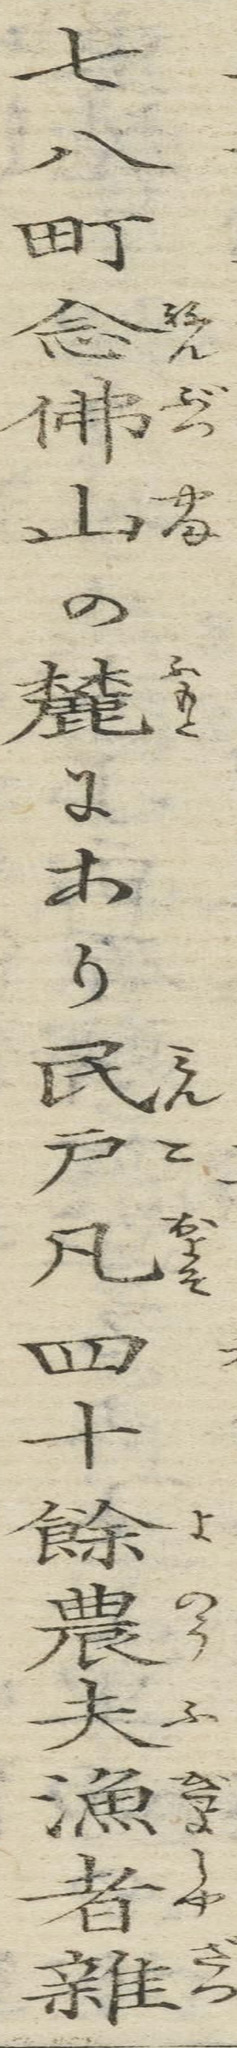七八町念仏山の麓にあり民戸凡四十余農夫漁者雑
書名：豆州熱海誌　完
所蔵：東京大学地震研究所図書室 Earthquake Research Institute Library, The University of Tokyo, JAPAN
